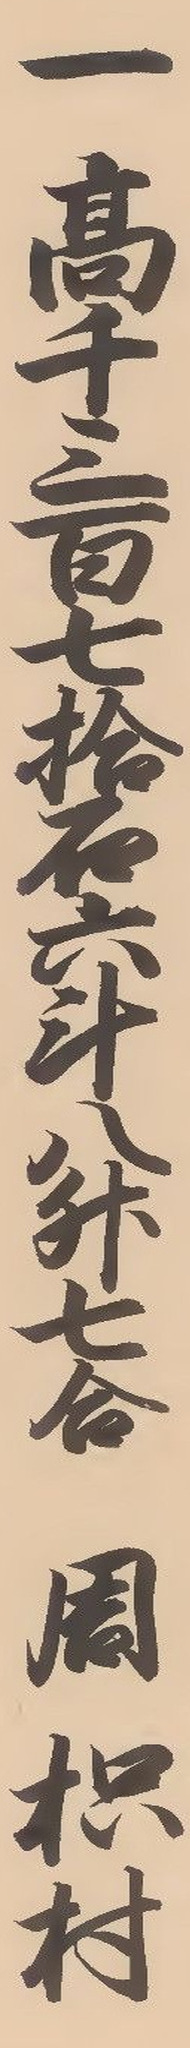一高千三百七拾石六斗八升七合周枳村
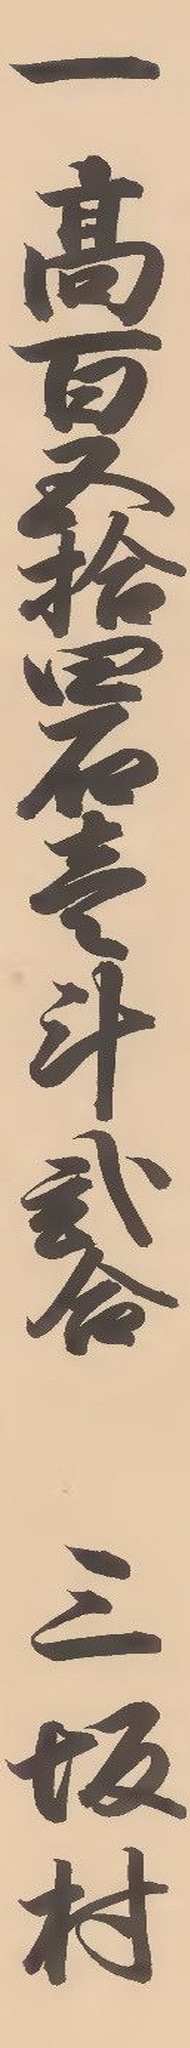一高百五拾四石壱斗弐合三坂村
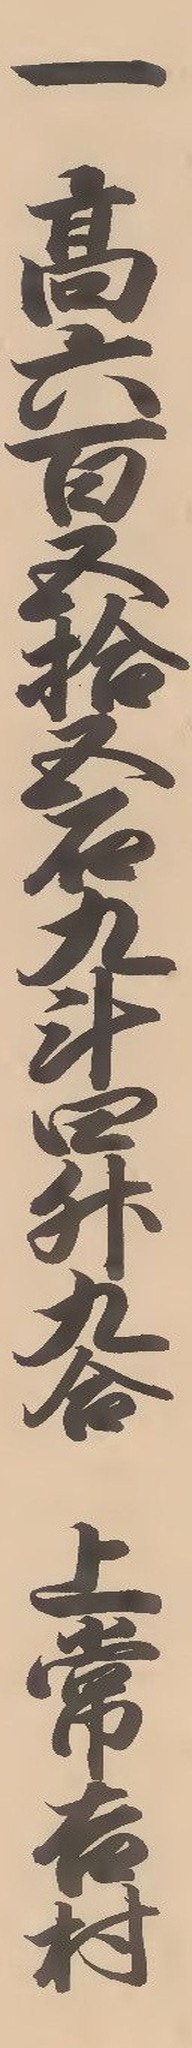一高六百五拾五石九斗四升九合上常吉村
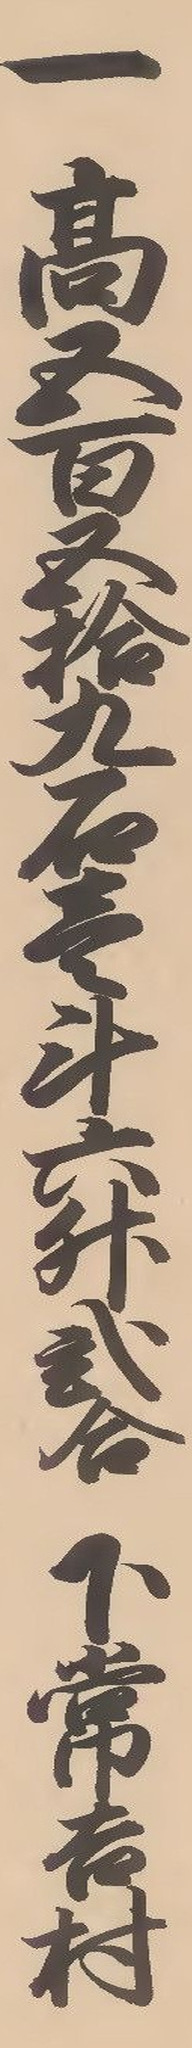一高五百五拾九石壱斗六升弐合下常吉村
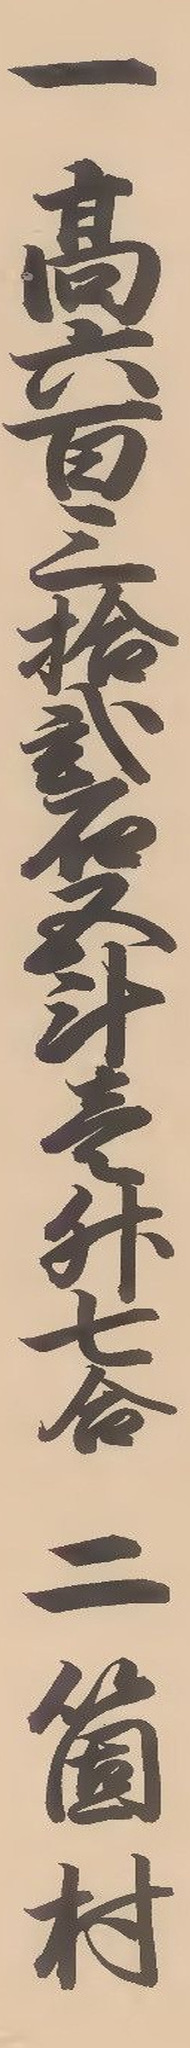一高六百三拾弐石五斗壱升七合二箇村

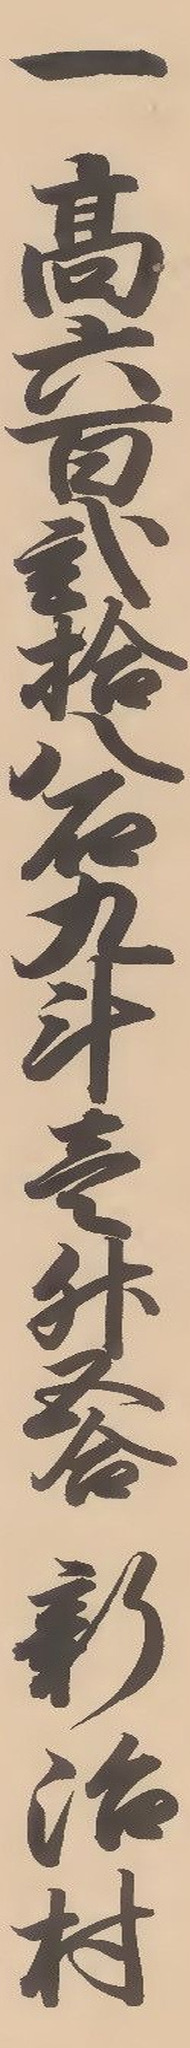一高六百弐拾八石九斗壱升五合新治村
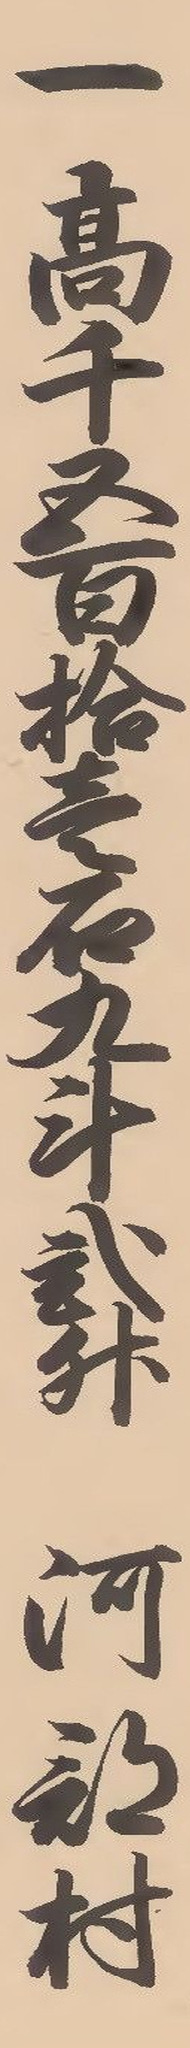一高千五百拾壱石九斗弐升河部村
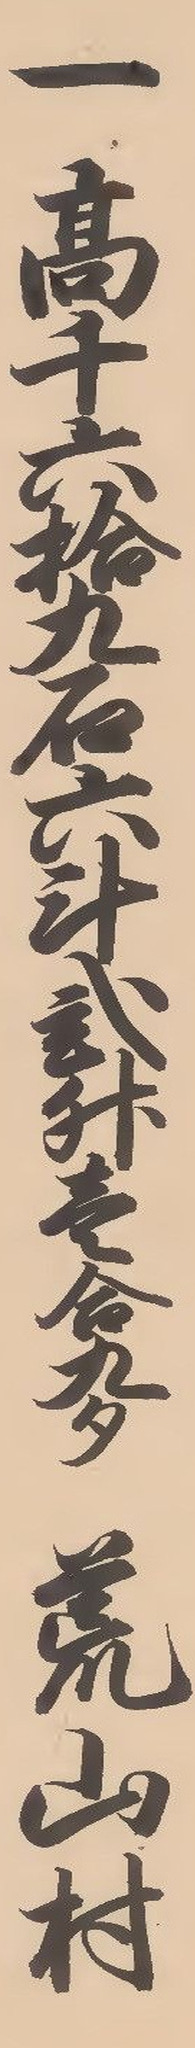一高千六拾九石六斗弐升壱合九勺荒山村
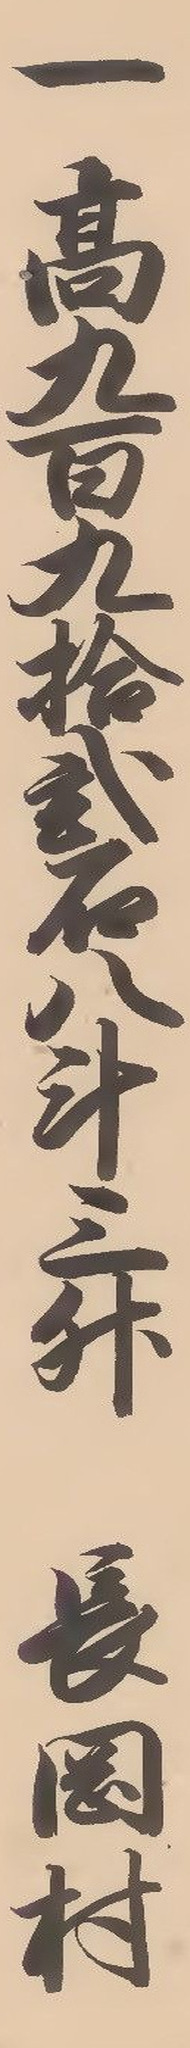一高九百九拾弐石八斗三升長岡村

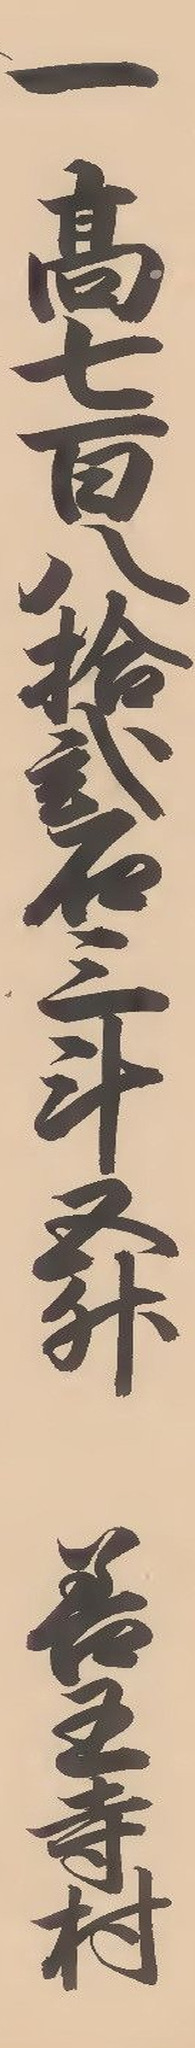一高七百八拾弐石三斗五升善王寺村
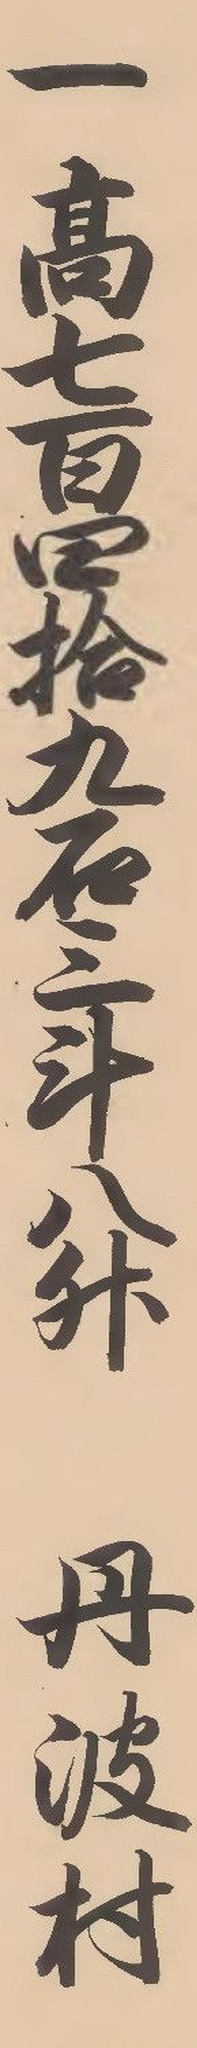一高七百四拾九石三斗八升丹波村
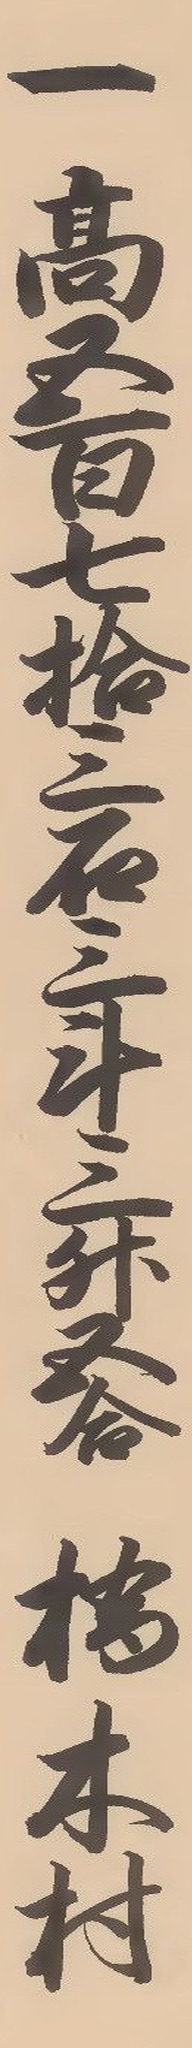一高五百七拾三石三斗三升五合橋木村
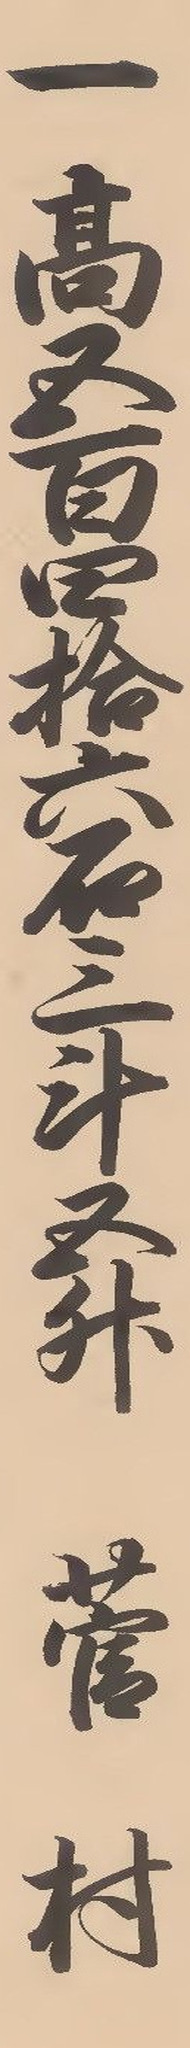一高五百四拾六石三斗五升菅村
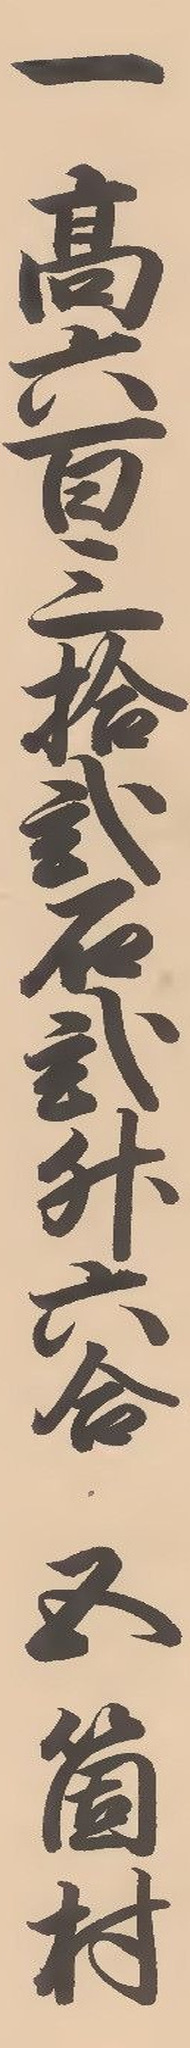一高六百三拾弐石弐升六合五箇村
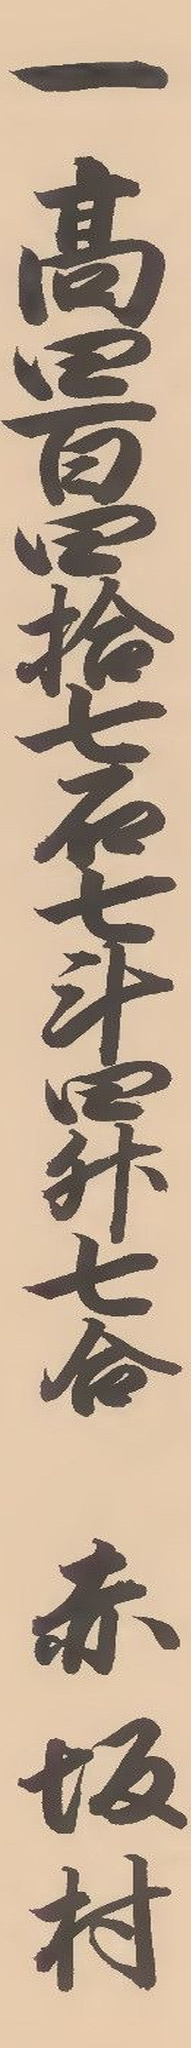一高四百四拾七石七斗四升七合赤坂村
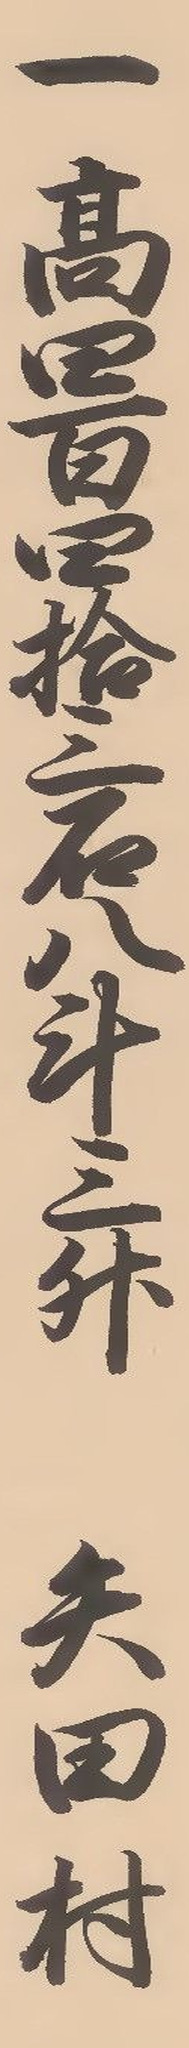一高四百四拾三石八斗三升矢田村
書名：丹後国郷帳
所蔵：国立公文書館 National Archives of Japan
